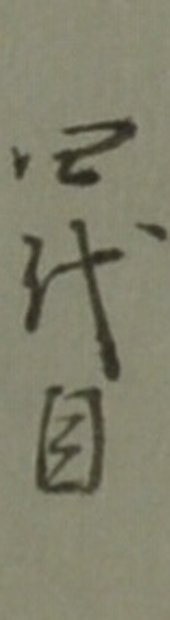四代目
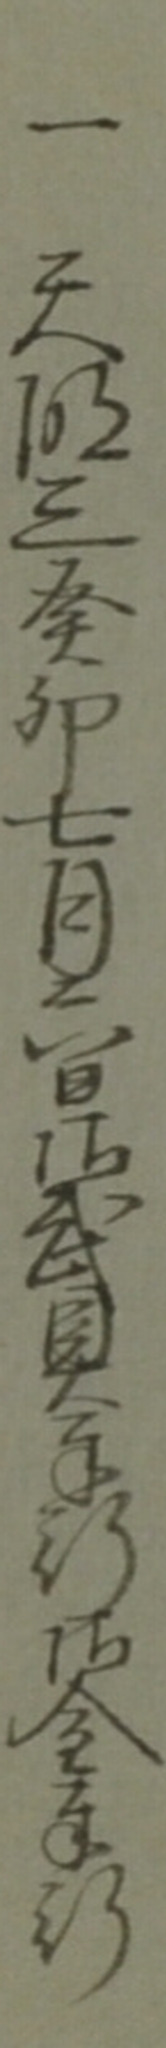一天明三癸卯七月六日御武具奉行御金奉行
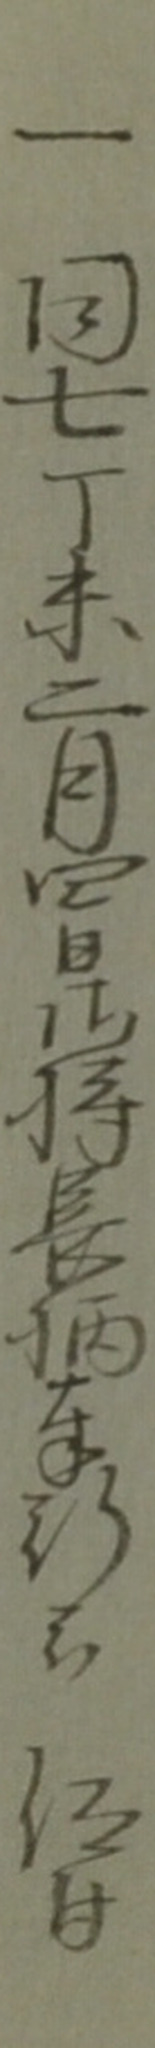一同七丁未二月四日御持長柄奉行被仰付
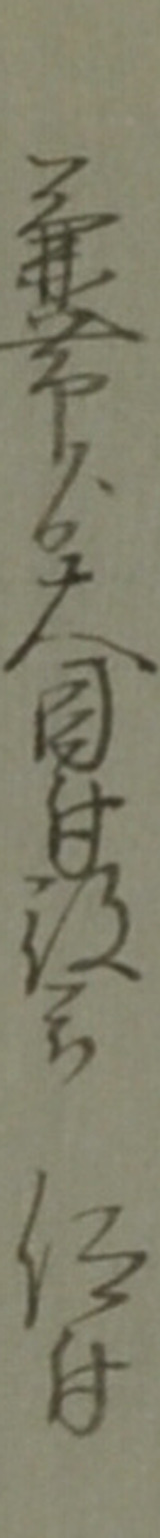兼帯ゟ大目付役被仰付
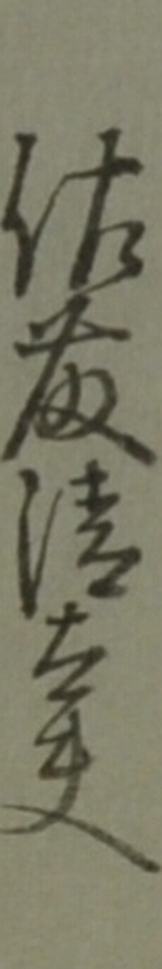佐藤清太夫
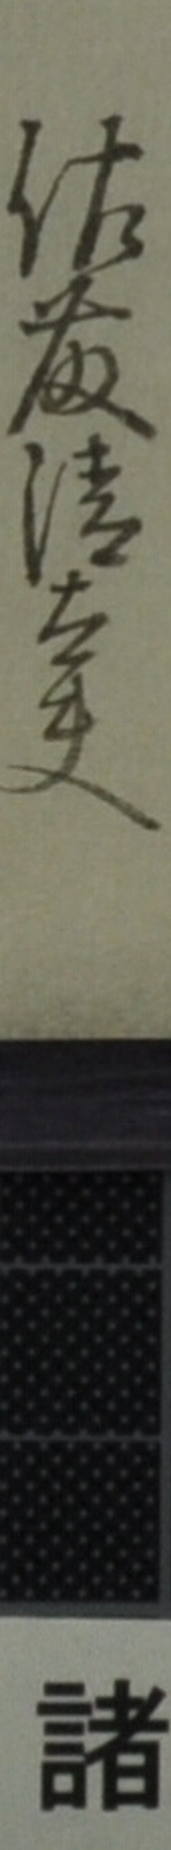佐藤清太夫
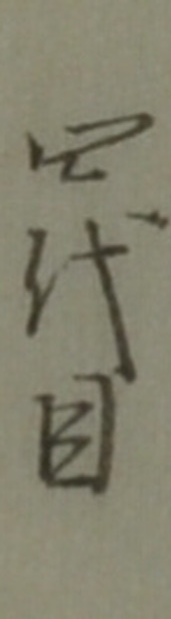四代目
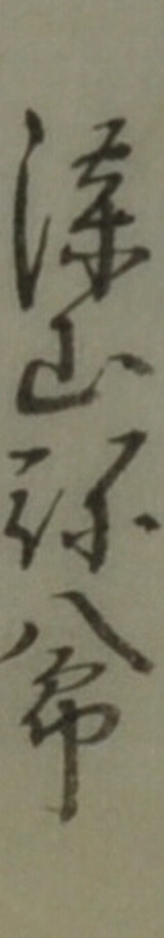津山弥八郎
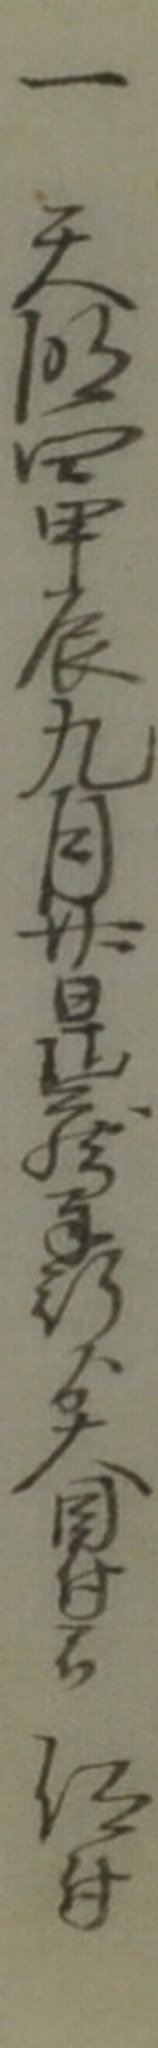一天明四甲辰九月廿日御蔵奉行ゟ大目付被仰付
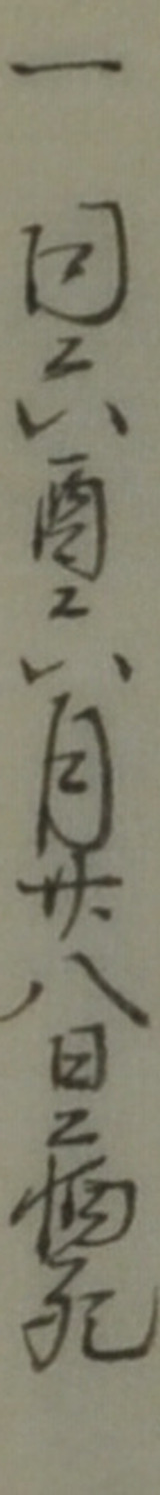一同六酉六月廿八日病死
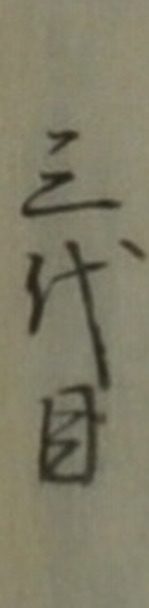三代目
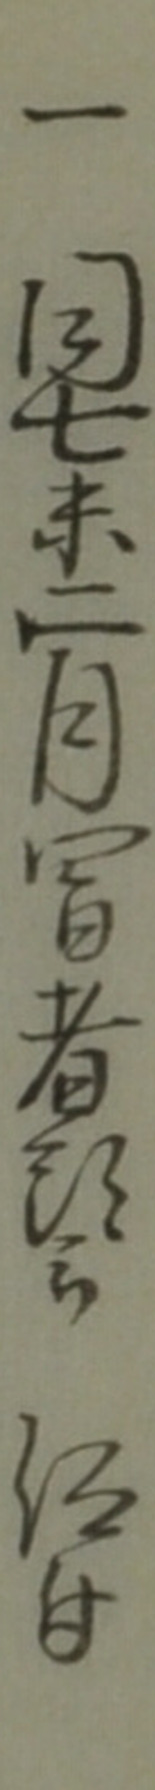一同七未二月四日者頭被仰付
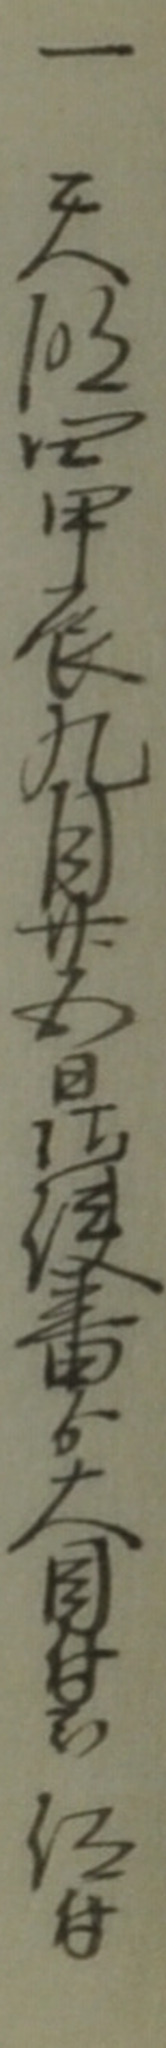一天明四甲辰九月廿五日御使番ゟ大目付被仰付
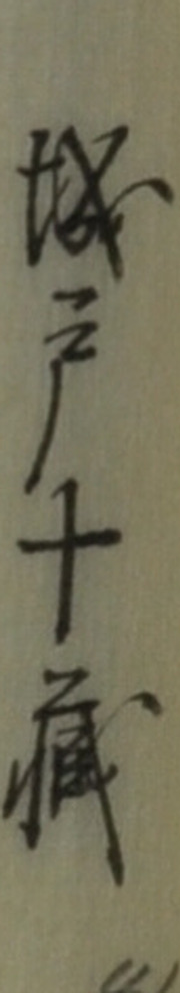城戸十蔵
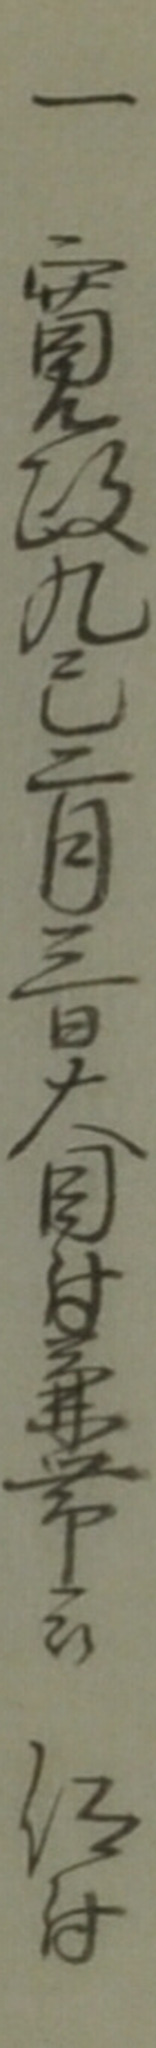一寛政九巳二月三日大目付兼帯被仰付
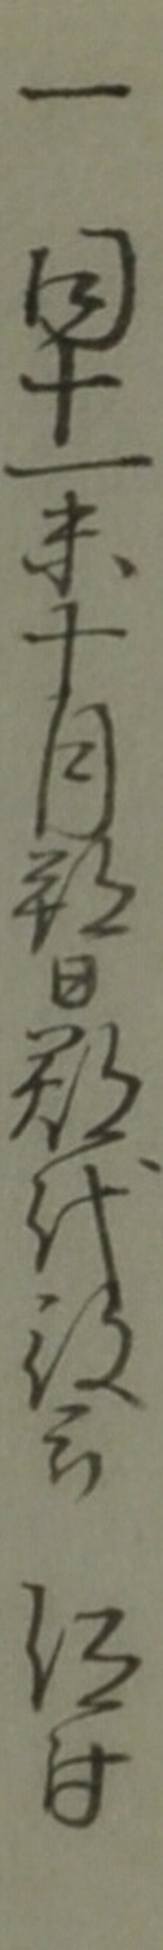一同十一未十月朔日郡代役被仰付
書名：諸御役代々録（三）
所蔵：伊那市立高遠町図書館・合同会社AMANE
